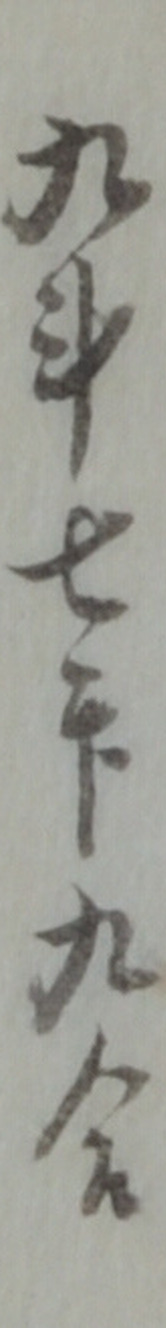九斗七升九合
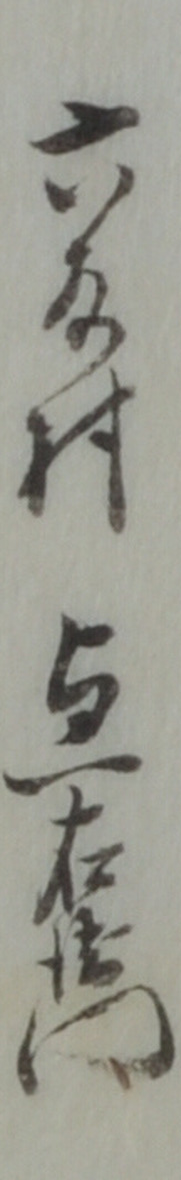六反村与一右衛門
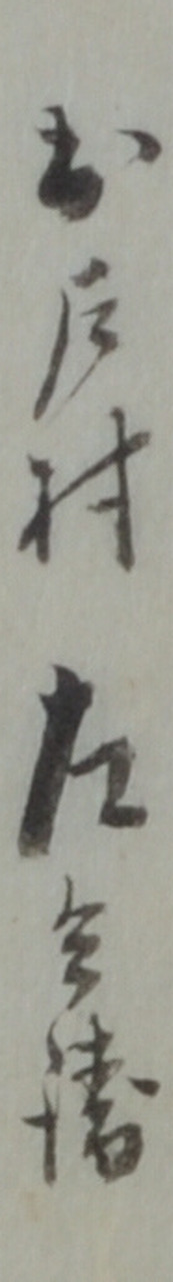出戸村左兵衛
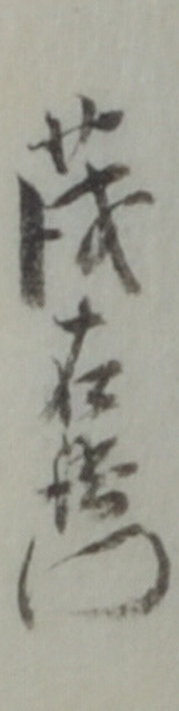茂右衛門

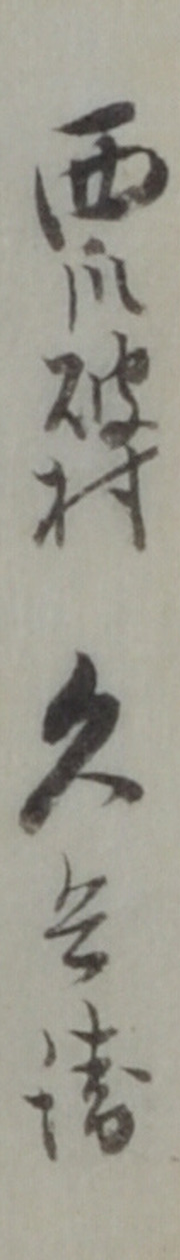西爪破村久兵衛
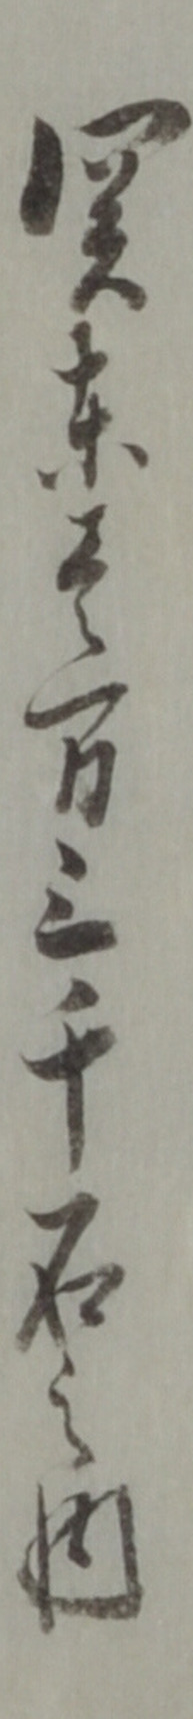関東壱万三千石之内
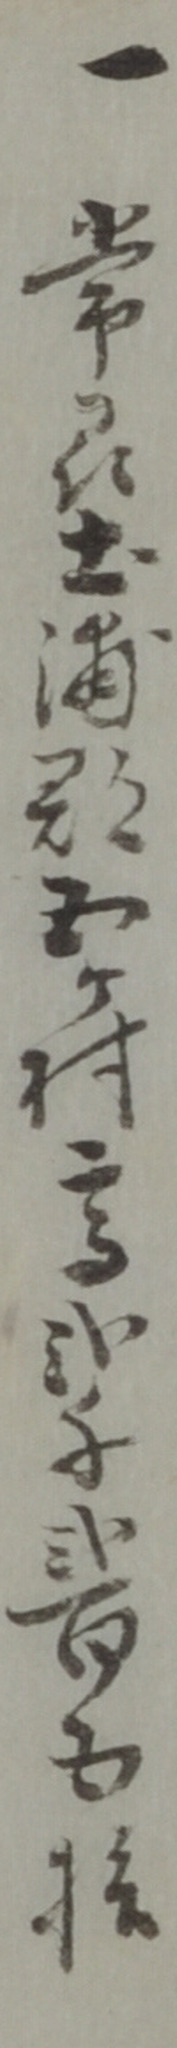一常州土浦郡五ケ村高弐千弐百五拾
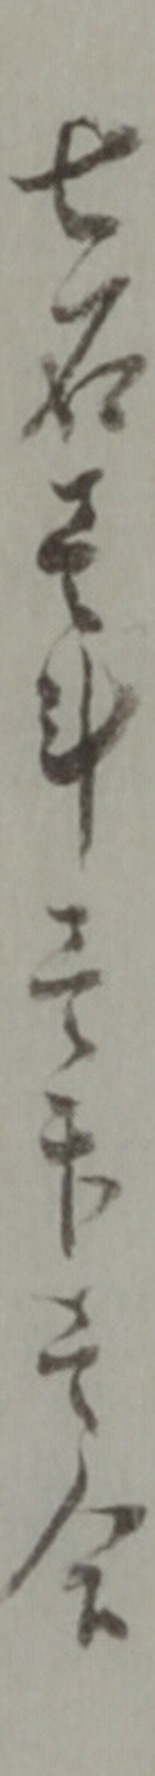七石壱斗壱升壱合
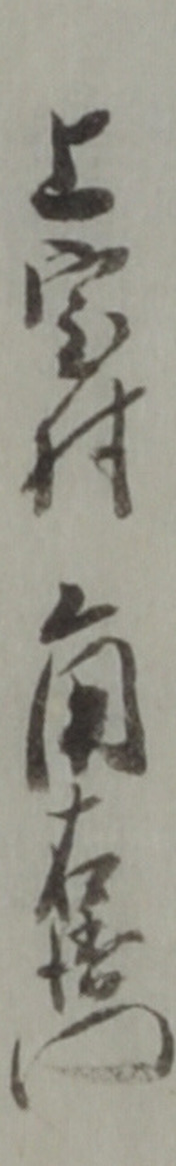上宝村角右衛門
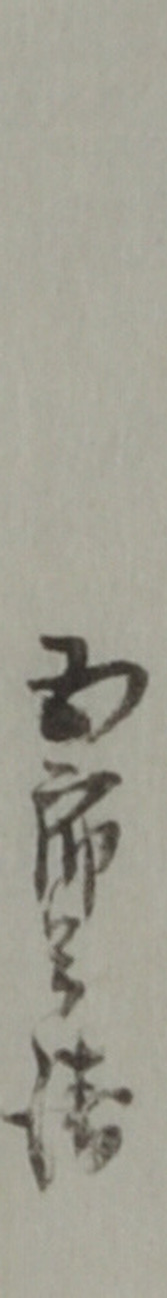五郎兵衛
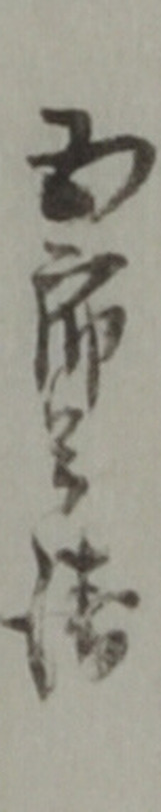五郎兵衛
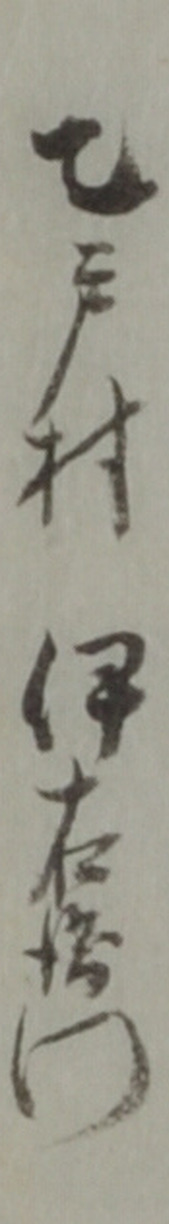乙戸村伊右衛門
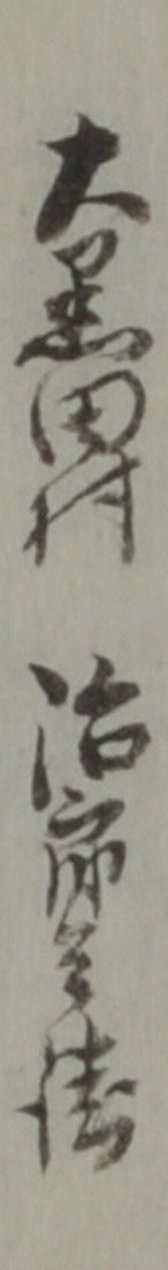大黒田村治郎兵衛
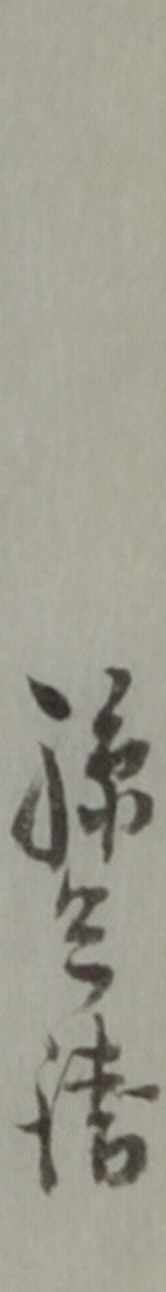孫兵衛
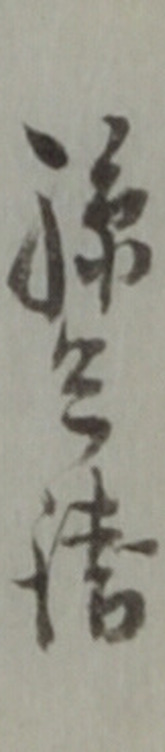孫兵衛
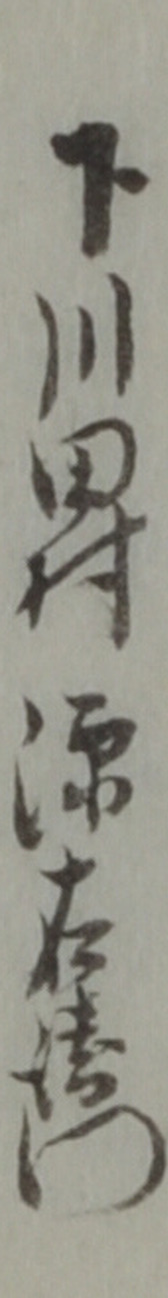下川田村源右衛門
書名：内藤重頼公御代分限帳（写）
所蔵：伊那市立高遠町図書館・合同会社AMANE
